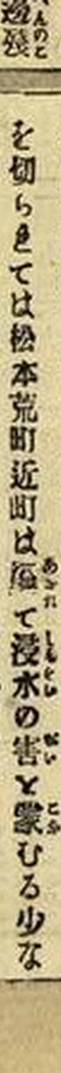を切られては松本荒町近町は溢て浸水の害を蒙むる少な
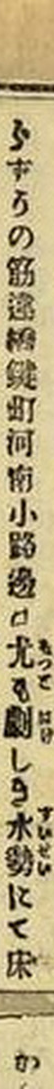らずかの筋違橋鍵町河南小路辺は尤も劇しき水勢にて床
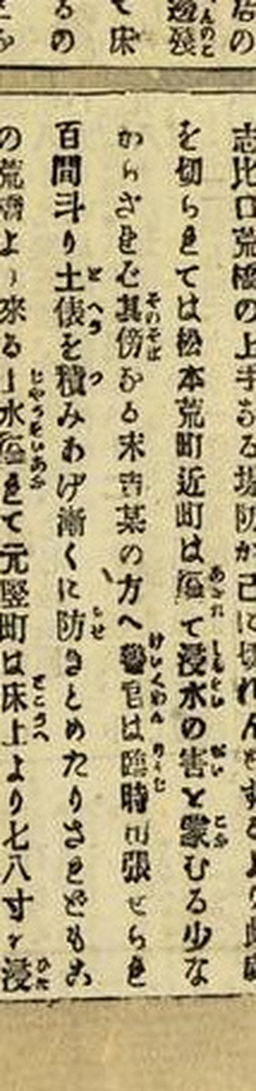からざれば其傍なる宗吉某の方へ警官は臨時出張せられ
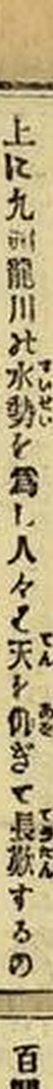上に九頭龍川の水勢を為し人々は天を仰ぎて長歎するの
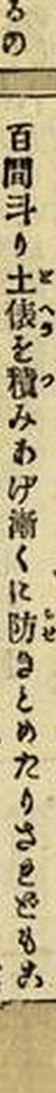百間斗り土俵を積みあげ漸くに防きとめたりされどもこ
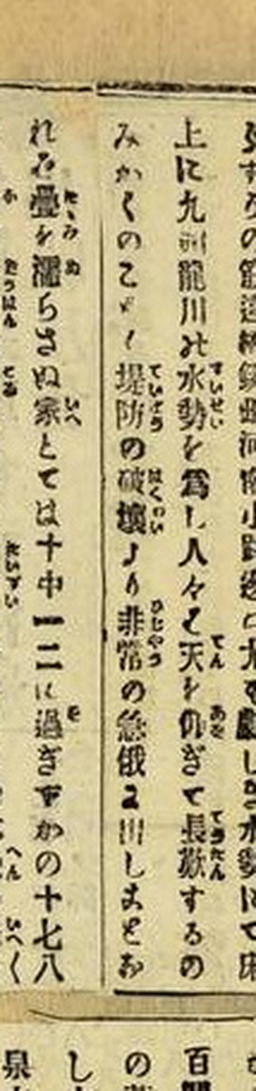みかくのことく堤防の破壊より非常の急俄に出しことあ
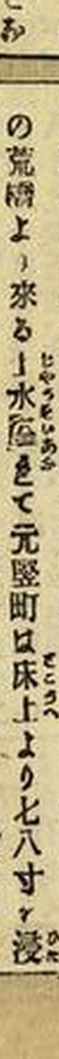の荒橋より来る上水溢れて元竪町は床上より七八寸も浸
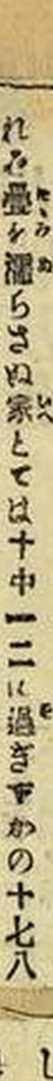れば畳を濡らさぬ家とては十中一二に過ぎずかの十七八
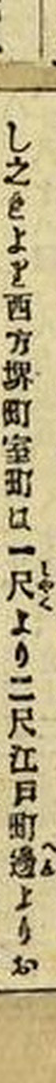し之れより西方堺町室町は一尺より二尺江戸町辺よりお
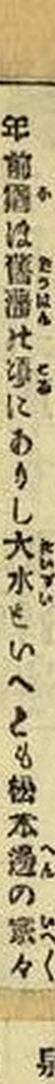年前猶ほ旧藩の頃にありし大水といへとも松本辺の家々
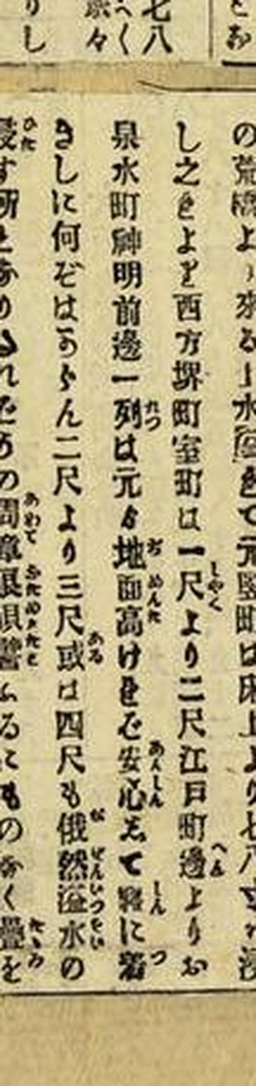泉水町神明前辺一列は元ゟ地面高ければ安心して寝に着
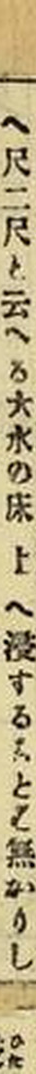へ尺二尺と云へる大水の床上へ浸することは無かりし
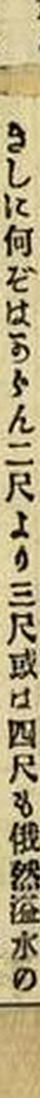きしに何ぞはからん二尺より三尺或は四尺も俄然溢水の
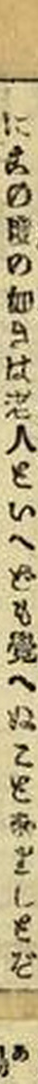にこの度の如きは老人といへども覚へぬことなりしとぞ
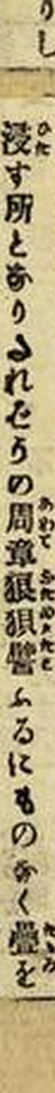浸す所となりたればかの周章狼狽譬ふるにものなく畳を
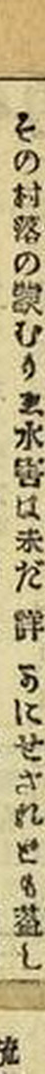その村落の蒙むりし水害は未だ詳かにせざれども蓋し
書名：温古集 五巻
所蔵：福井県文書館 Fukui Prefectural Archives
